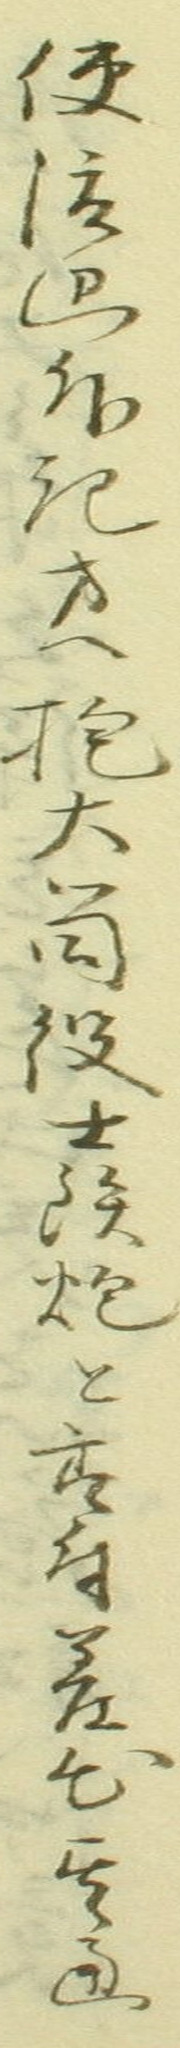使渡辺外記方へ抱大筒役士鉄砲と？付差出其通
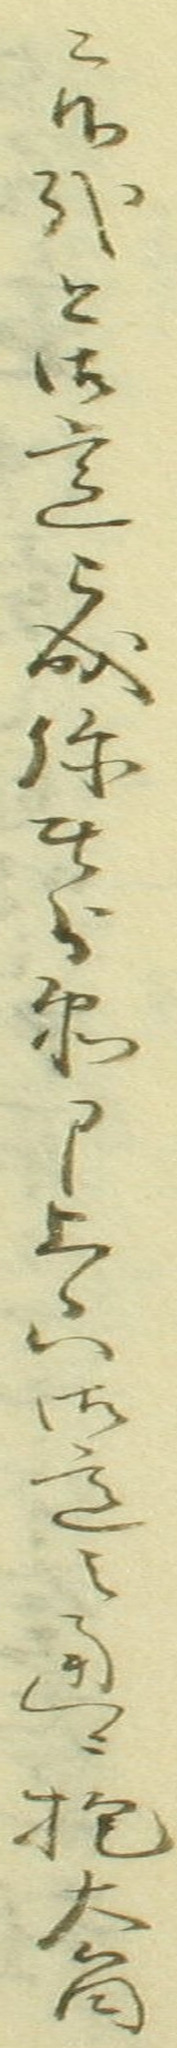に候哉と御適被成弥二兵衛申上候は御適之通に抱大筒
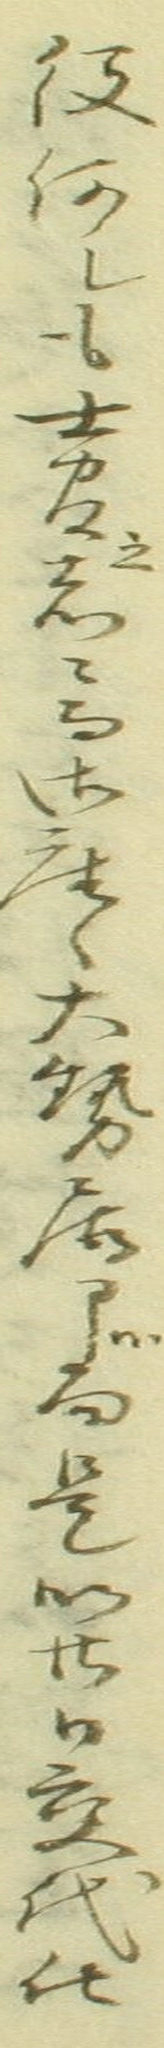役何れも士官之者にて御座候大勢居申候而是以廿日交代仕
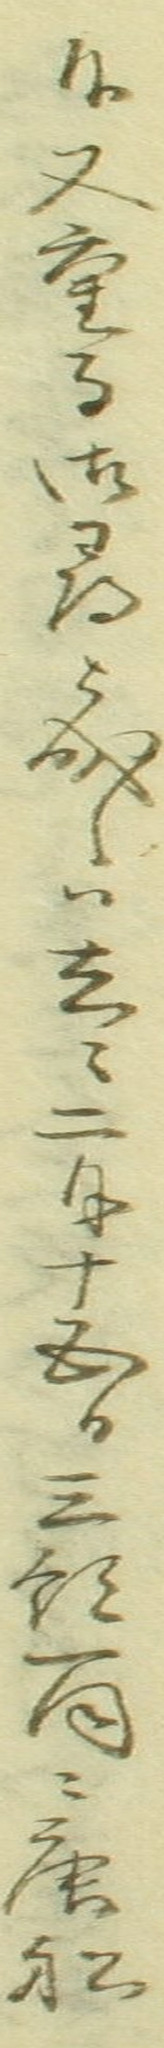候又重而御尋被成候は去去二月十五日三領一同に唐船
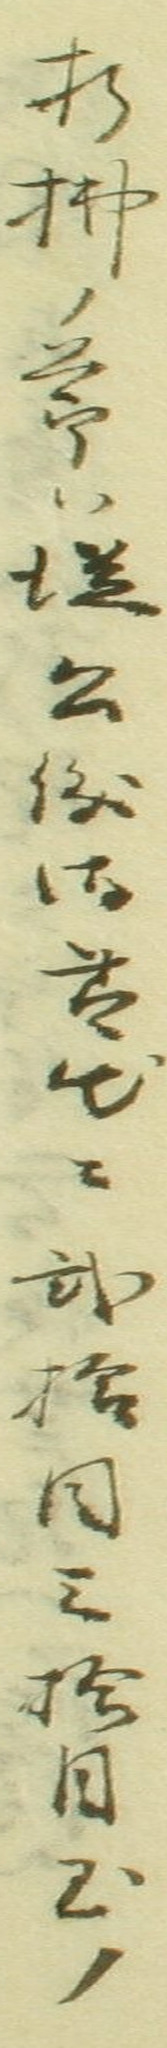打払の節は従公儀御？出に弐拾目三拾目玉の
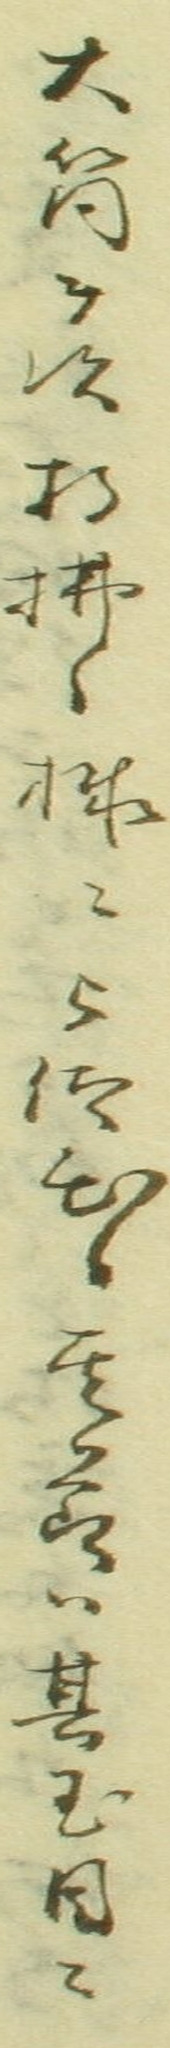大筒を次打払候様に被仰出候其節は其玉目に
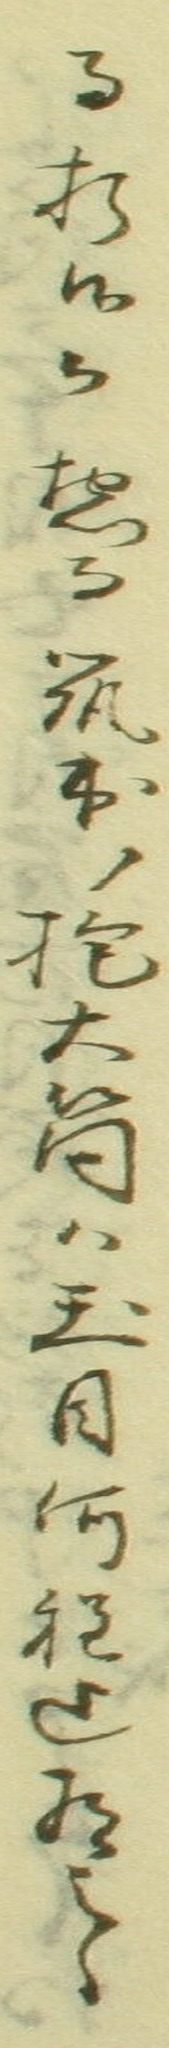而打候而惣而猟出の抱大筒は玉目何程迠有之候
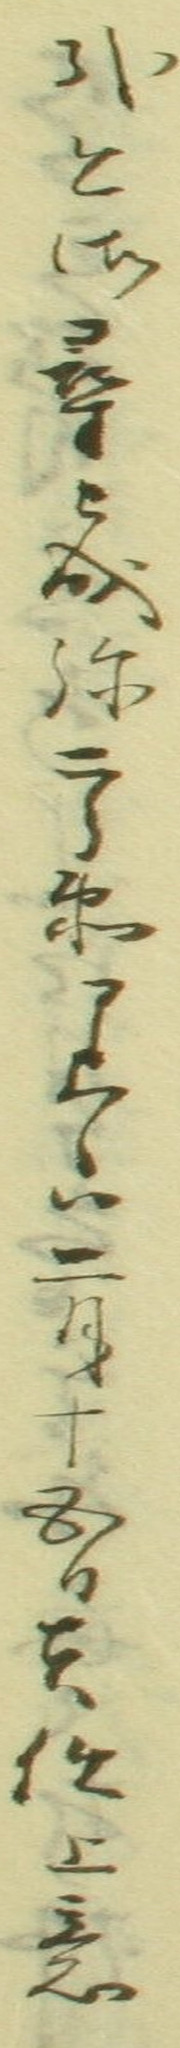哉と御尋被成弥二兵衛申上候は二月十五日？仕上意

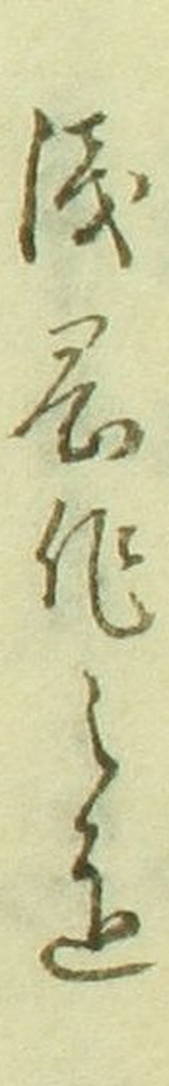浅岡作之進
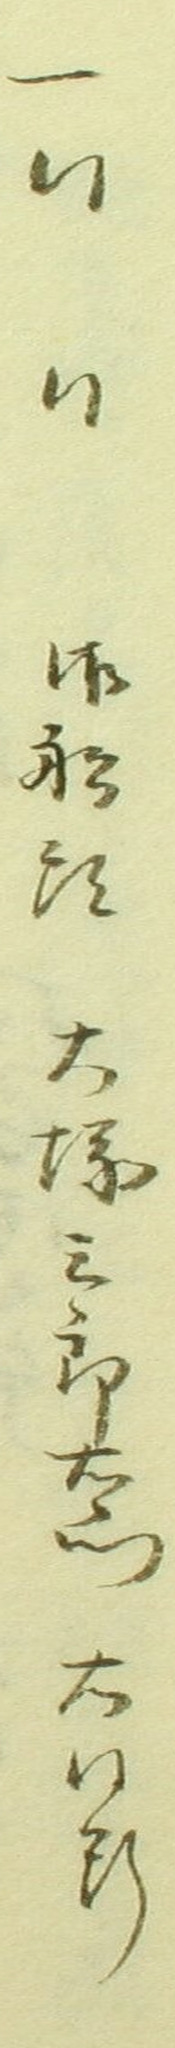一同同御船頭大塚三郎右衛門右同断
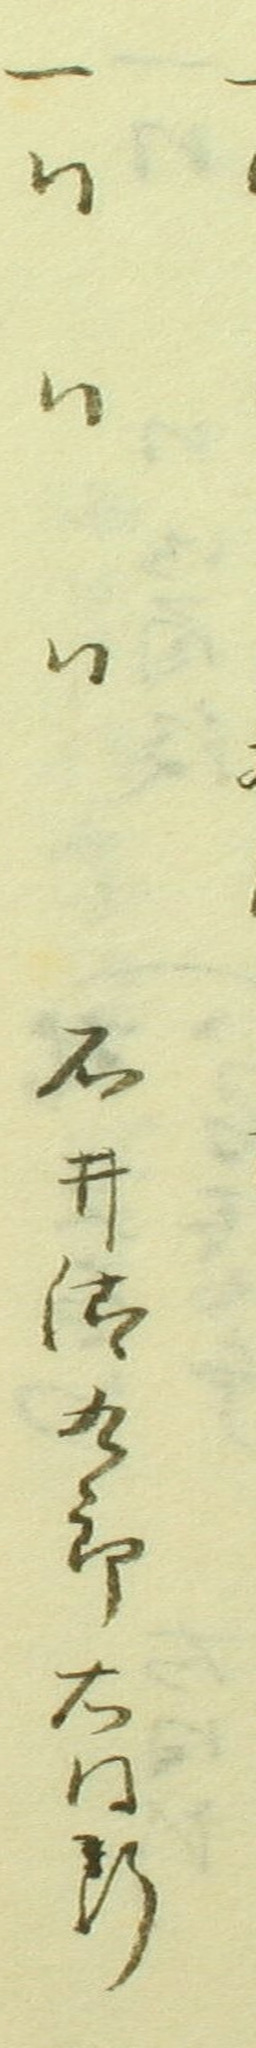一同同同石井清九郎右同断
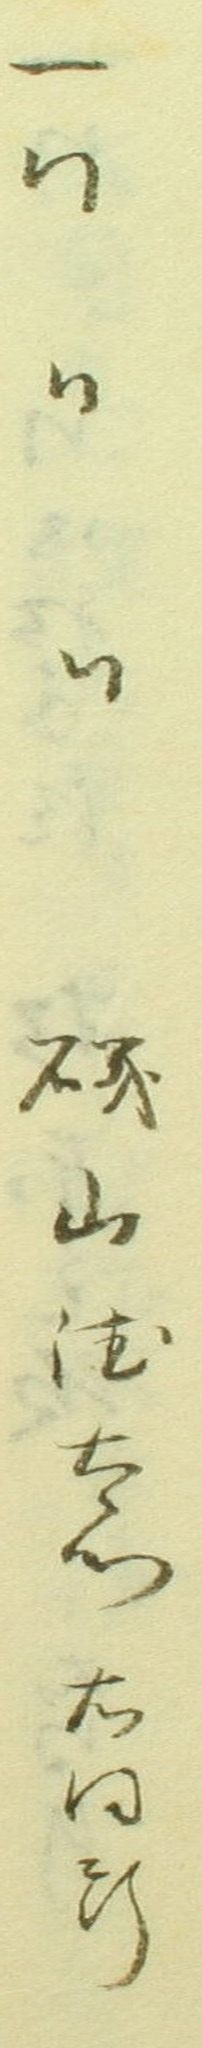一同同同磯山徳右衛門右同断
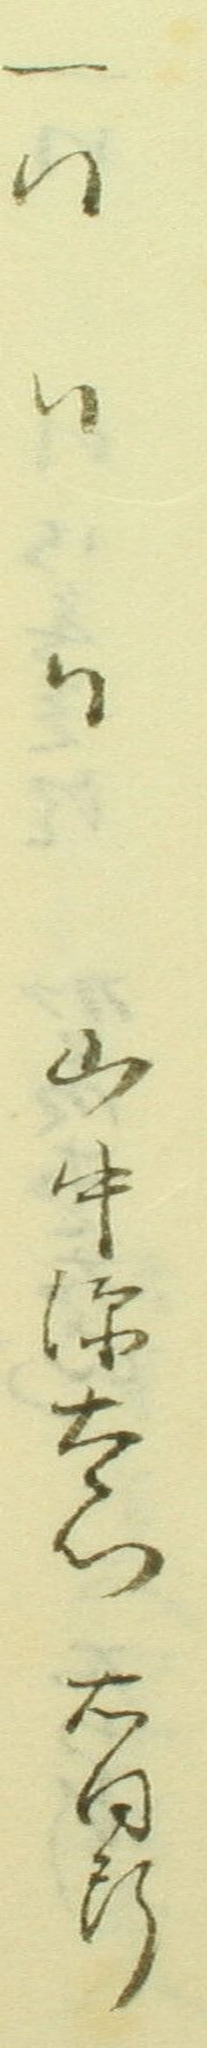一同同同山中弥右衛門右同断
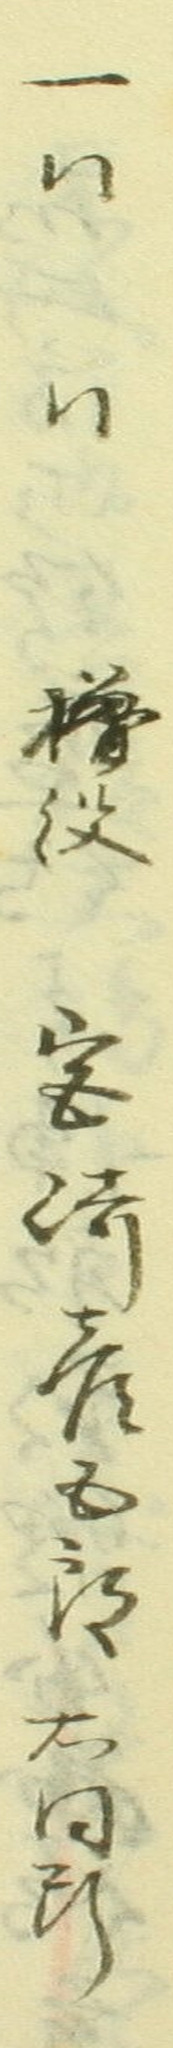一同同櫓役宮崎彦五郎右同断
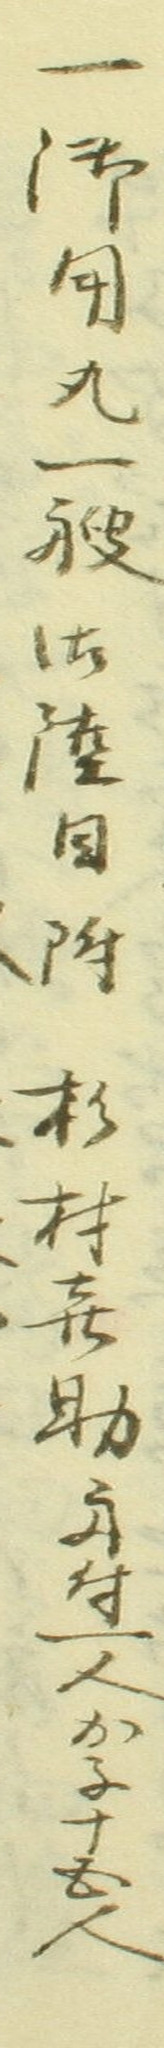一御用丸一艘岩屋定番新野半六舟付一人加子十五人
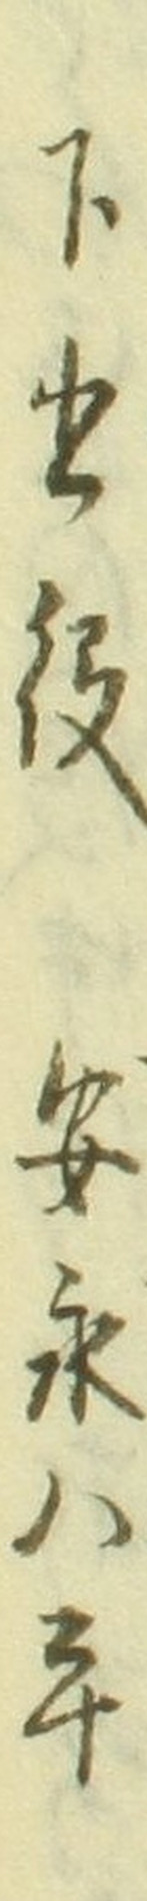下出役安永八平
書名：唐船漂流記 四
